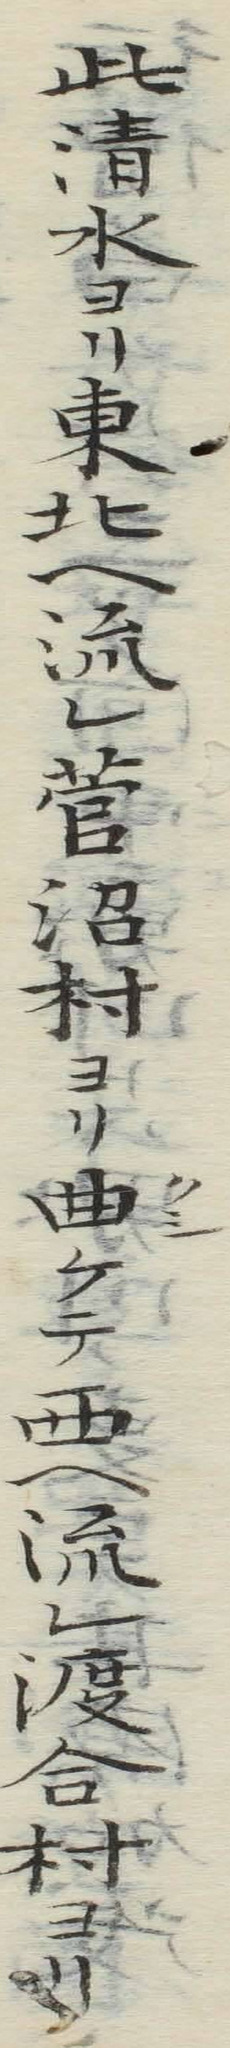此清水ヨリ東北ヘ流レ菅沼村ヨリ曲ケテ西ヘ流レ渡合村ヨリ
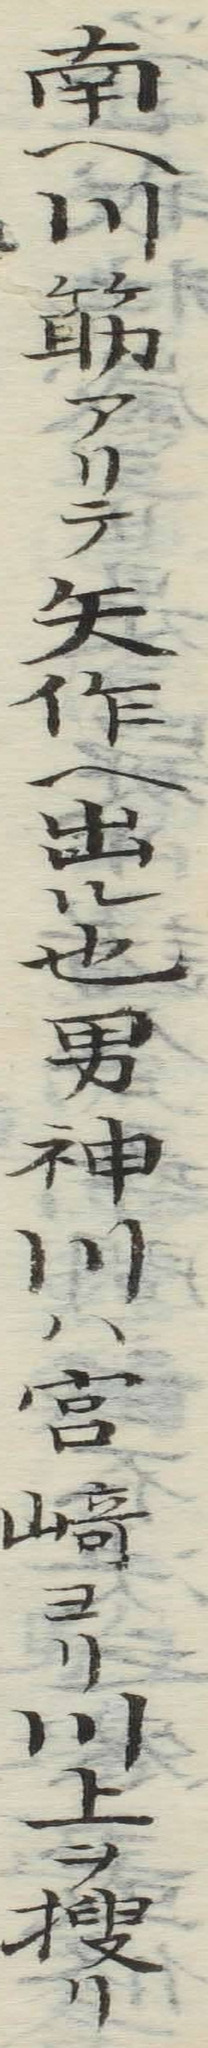南ヘ川筋アリテ矢作ヘ出ル也男神川ハ宮崎ヨリ川上ヲ搜リ
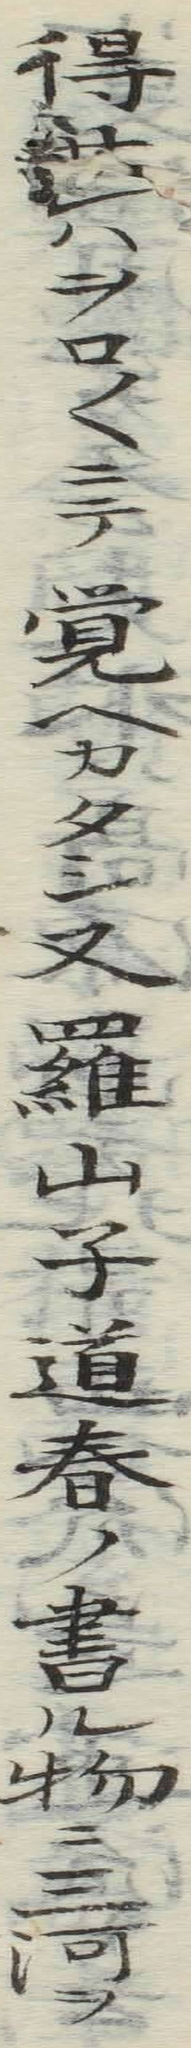得レハヲロ〳〵ニテ覚ヘカタシ又羅山子道春ノ書ル物ニ三河ヲ
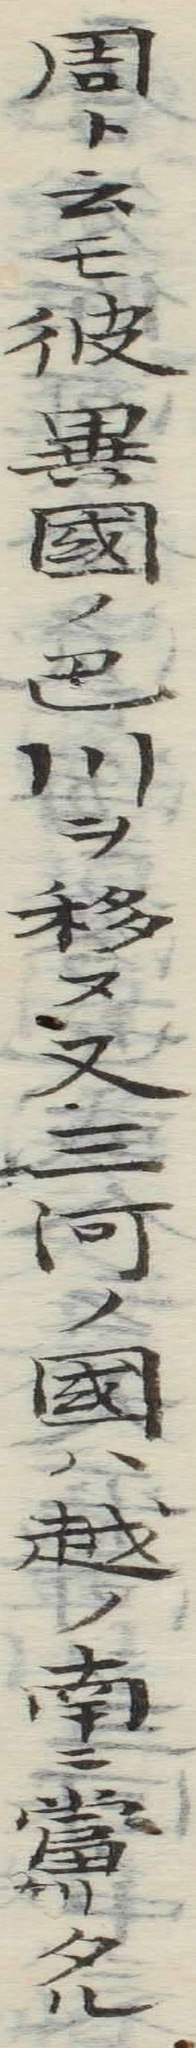周ト云モ彼異國ノ巴川ヲ移ヌ又三河ノ國ハ越ノ南ニ當リタル
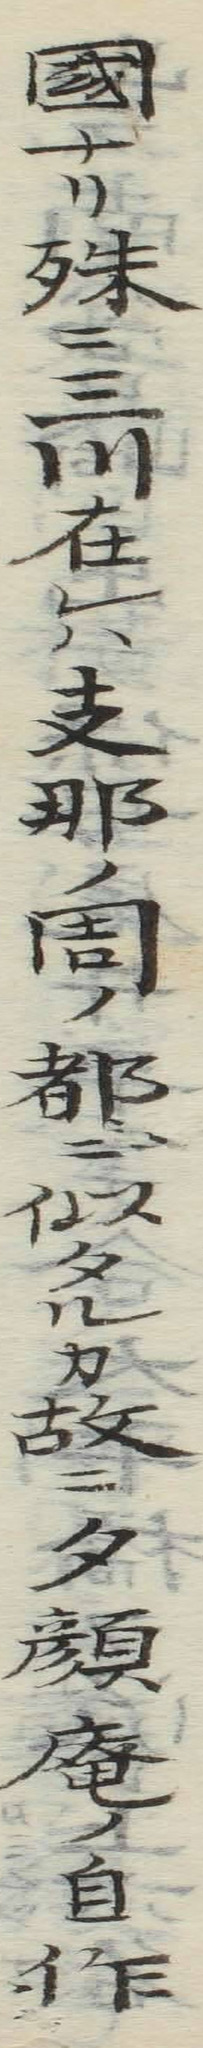國ナリ殊ニ三川在レハ支那ノ周ノ都ニ似タルカ故ニ夕顔庵ノ自作
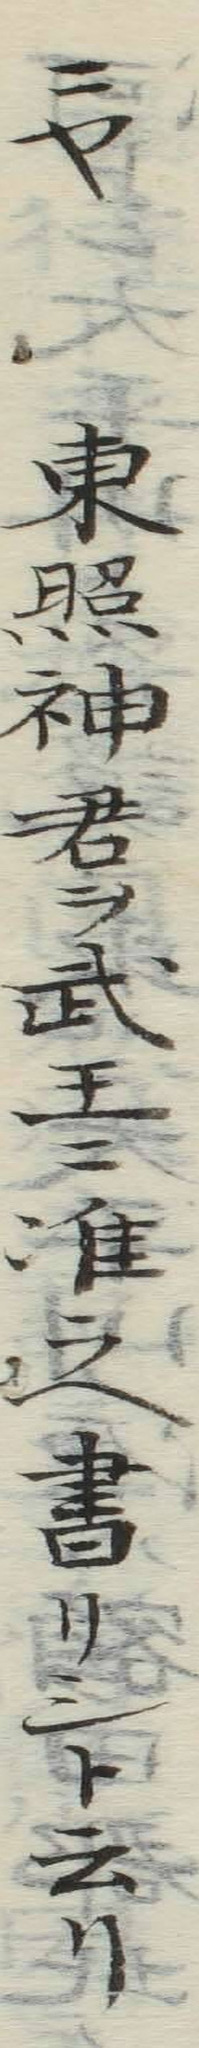ニヤ東照神君ヲ武王ニ准ラヘ書リシト云リ
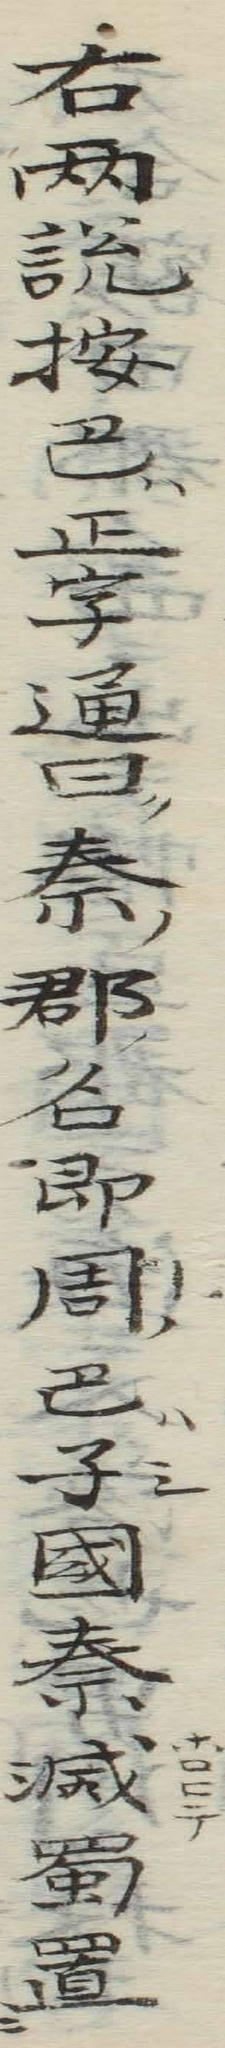右兩説按巴ハ正字通曰ク秦ノ郡名即周ノ巴ハ子國秦滅蜀置

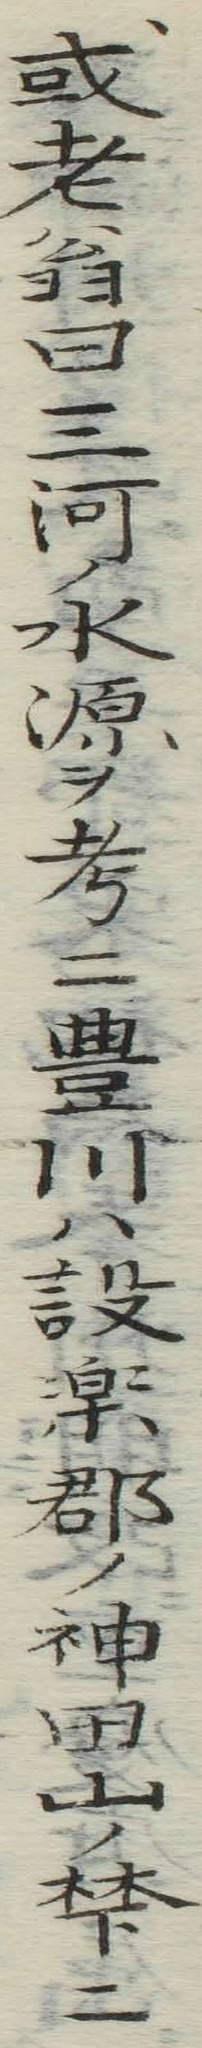或老翁曰三河ノ水源ヲ考ニ豊川ハ設楽郡ノ神田山ノ梺ニ
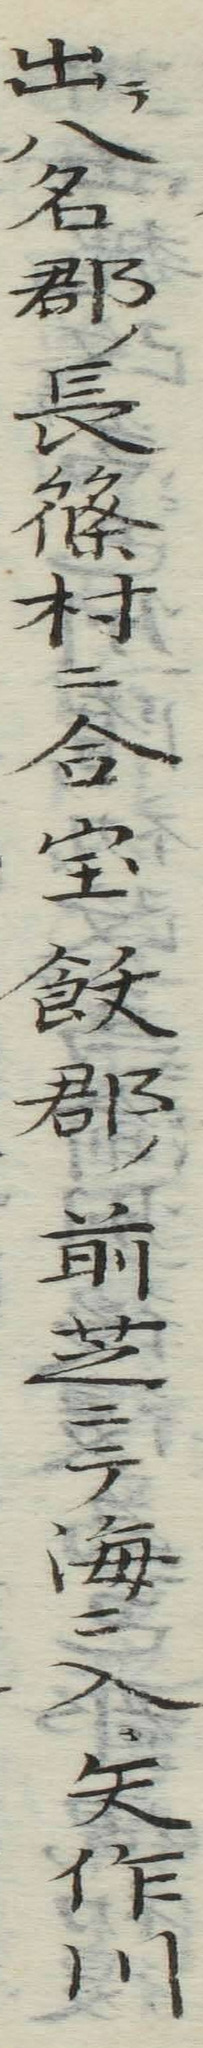出テ八名郡ノ長篠村ニ合宝飫郡ノ前芝ニテ海ニ入矢作川
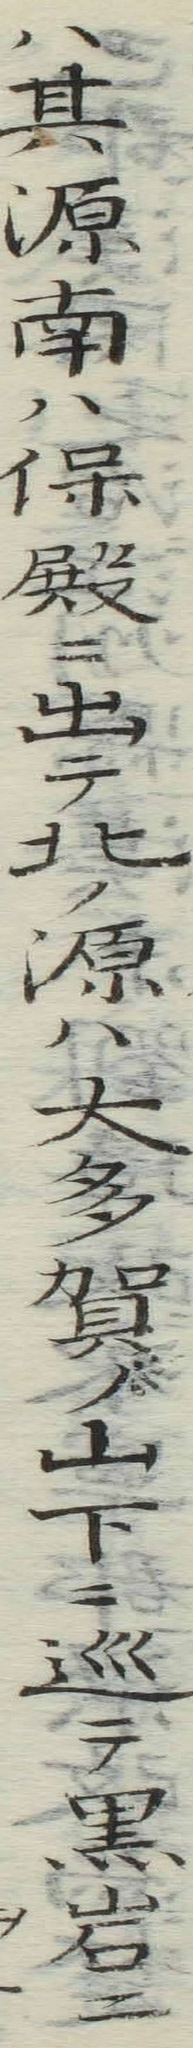ハ其源南ハ保殿ニ出テ北ノ源ハ大多賀ノ山下ニ巡テ黒岩ニ
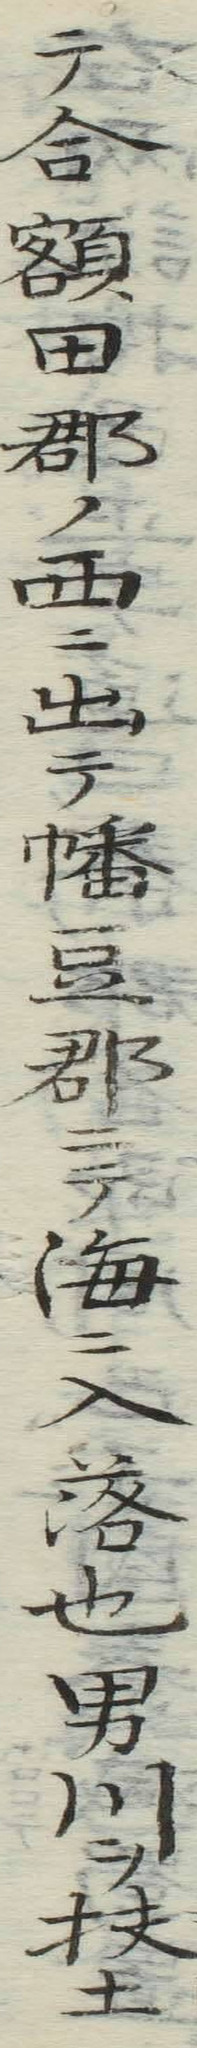テ合額田郡ノ西ニ出テ幡豆郡ニテ海ニ入落也男川ヲ扶土
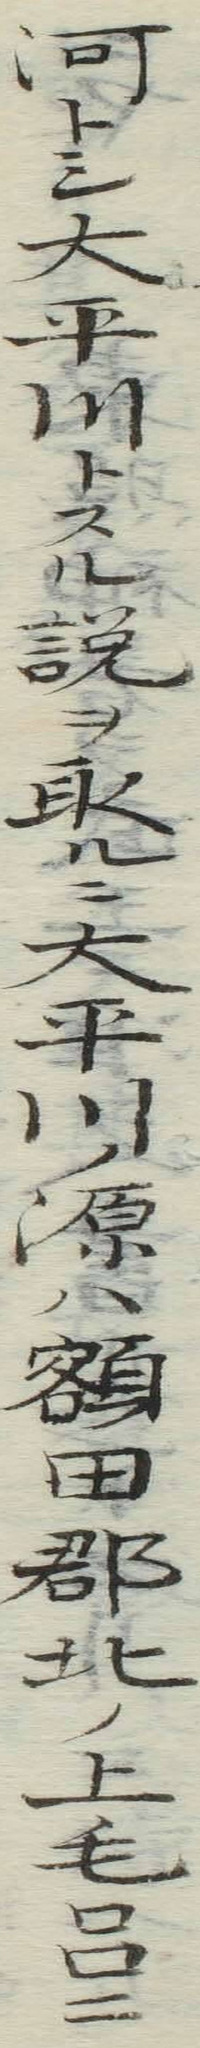河トシ大平川トスル説ヲ取ルニ大平川ノ源ハ額田郡北ノ上毛呂ニ
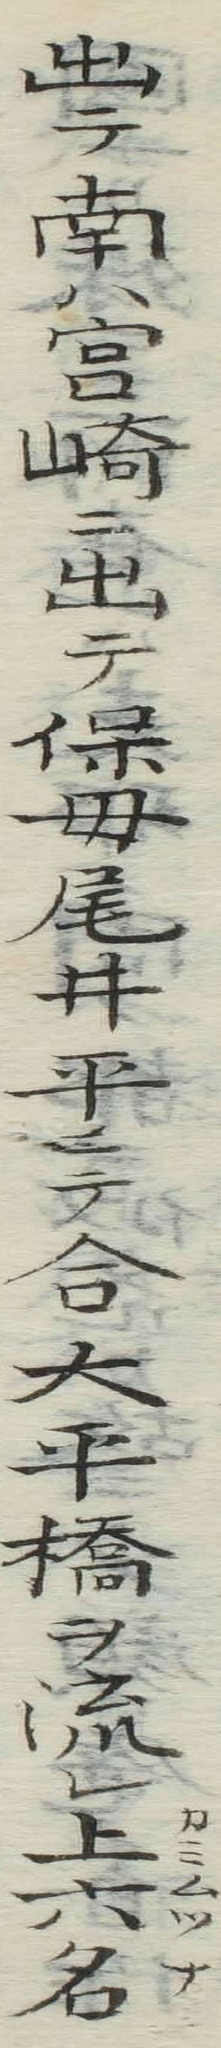出テ南ハ宮崎ニ出て保母尾井平ニテ合大平橋ヲ流れ上六名
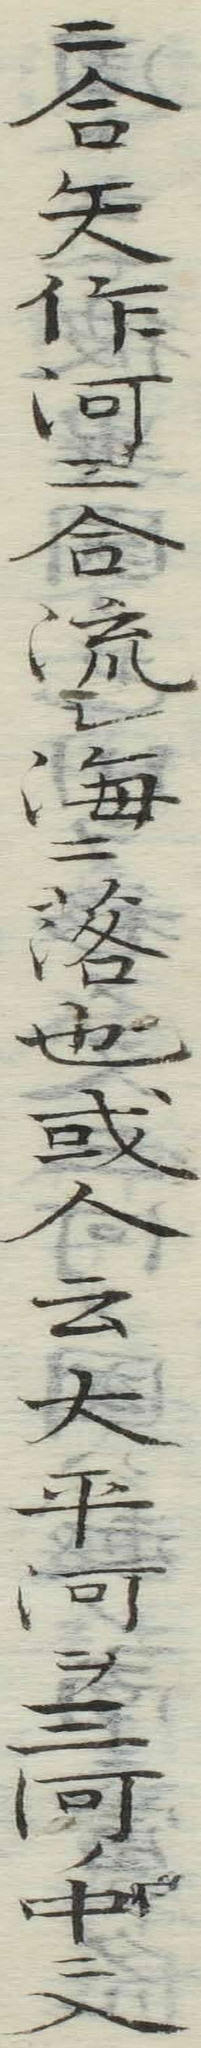ニ合矢作河ニ合流シ海ニ落也或人云大平河ヲ三河ノ中ニ入
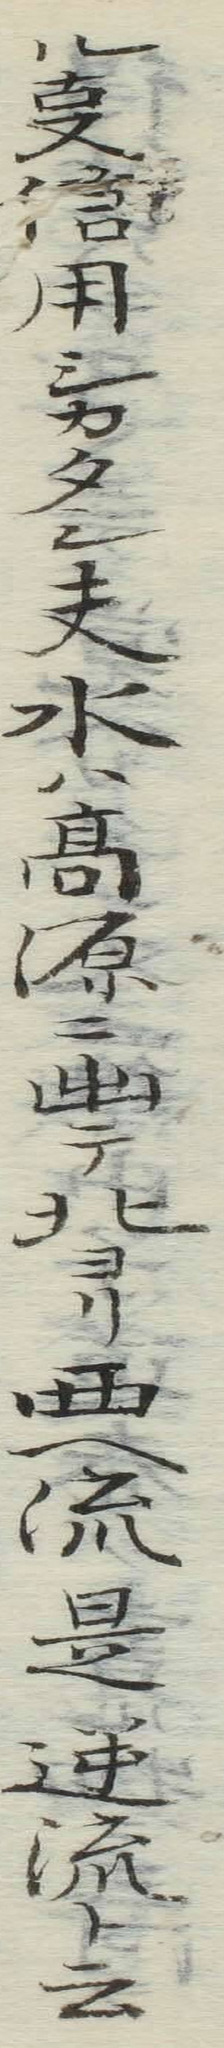ル事信用シカタシ夫水ハ髙源ニ出テ北ヨリ西ヘ流是逆流ト云
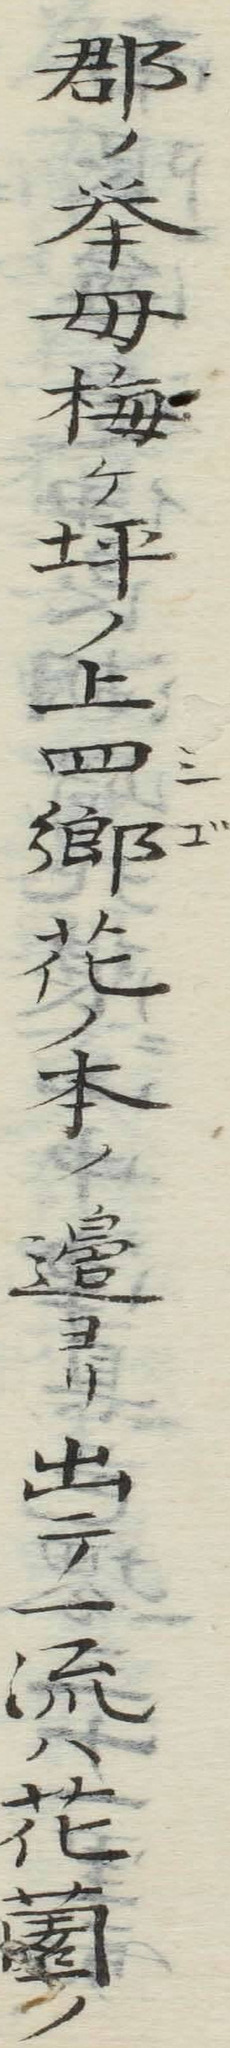郡ノ挙母梅ヶ坪ノ上四郷花ノ木ノ邉ヨリ出テ一流ハ花園ノ
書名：三河国二葉松
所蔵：国文学研究資料館
